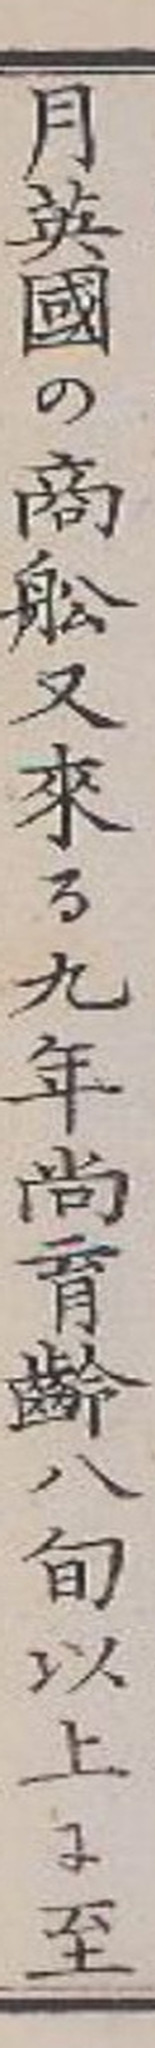月英国の商船又来る九年尚育齢八旬以上に至
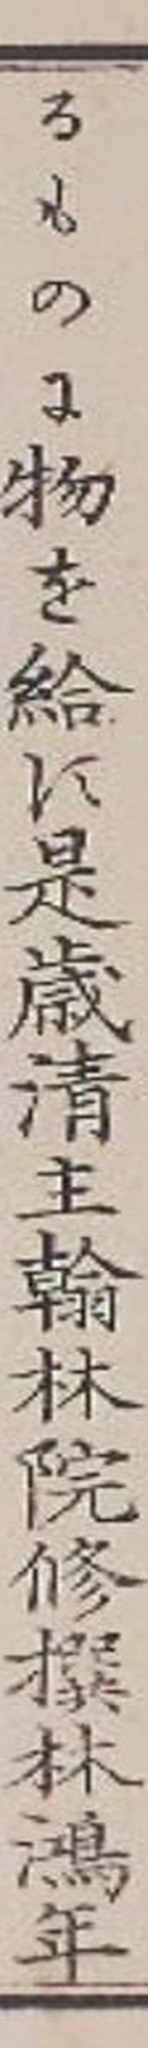るものに物を給す是歳清主翰林院修撰林鴻年
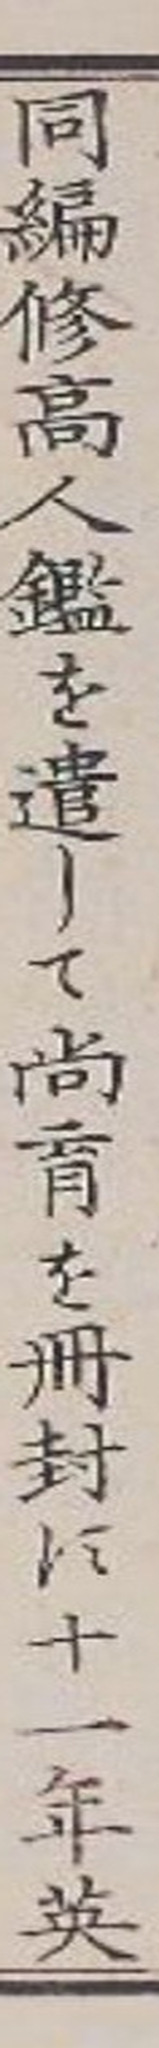同編修高人鑑を遣して尚育を冊封す十一年英
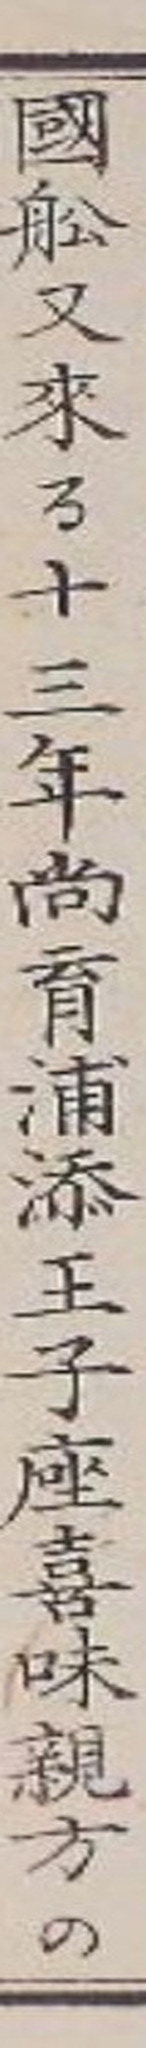国船又来る十三年尚育浦添王子座喜味親方の
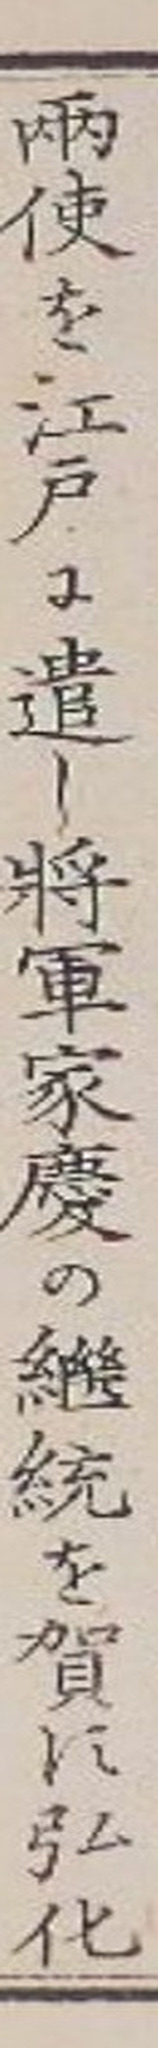両使を江戸に遣し将軍家慶の継統を賀す弘化
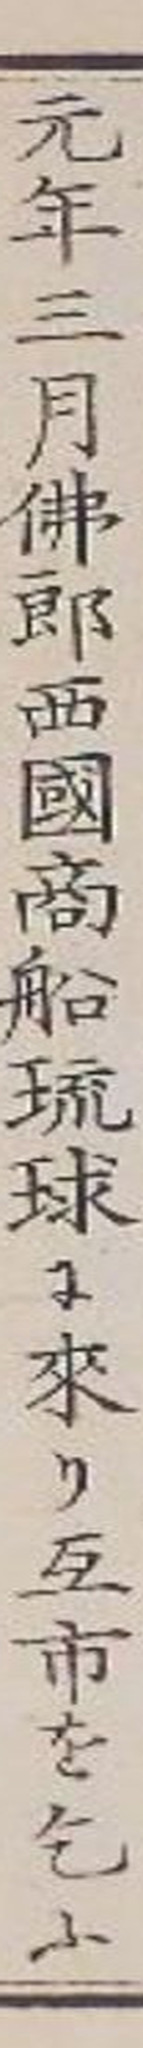元年三月仏郎西国商船琉球に来り互市を乞ふ
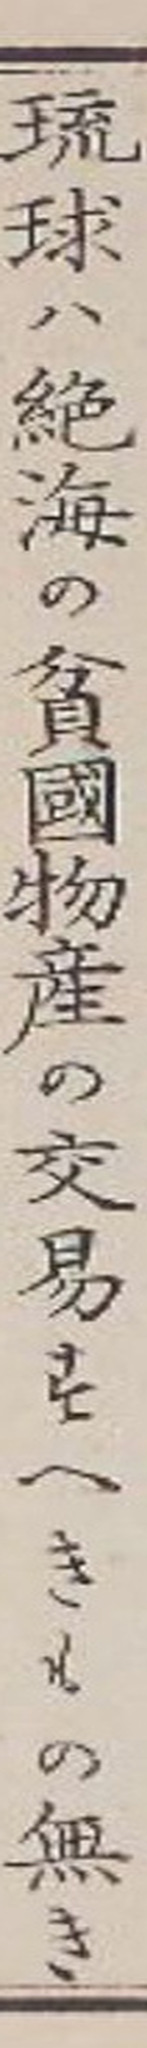琉球は絶海の貧国物産の交易すへきもの無き
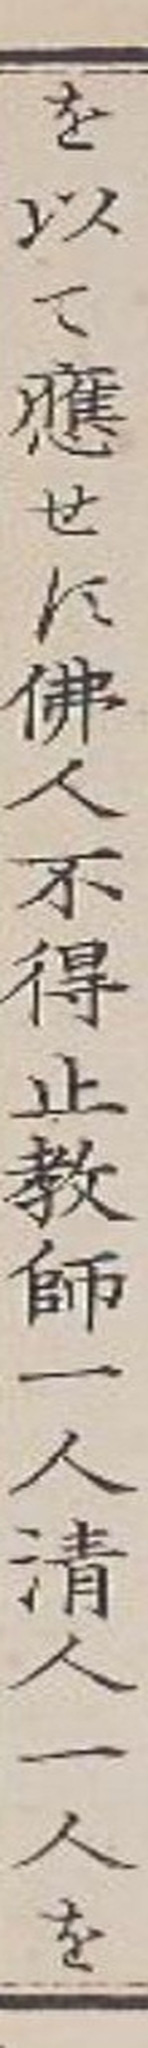を以て応せす仏人不得止教師一人清人一人を
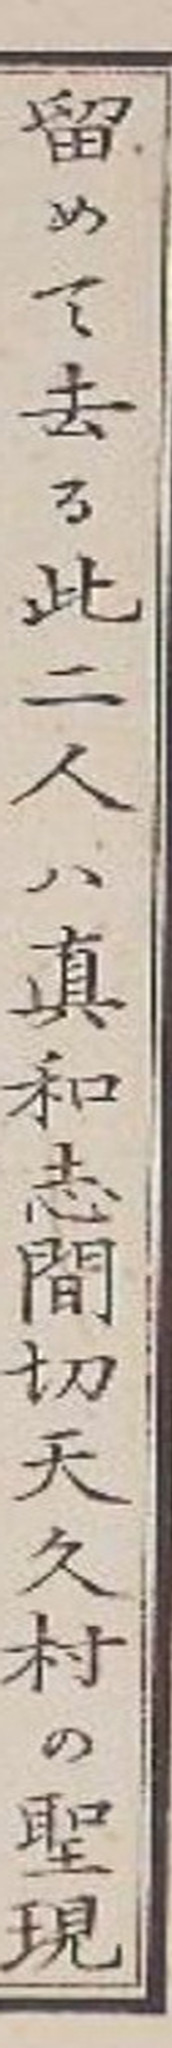留めて去る此二人は真和志間切天久村の聖現
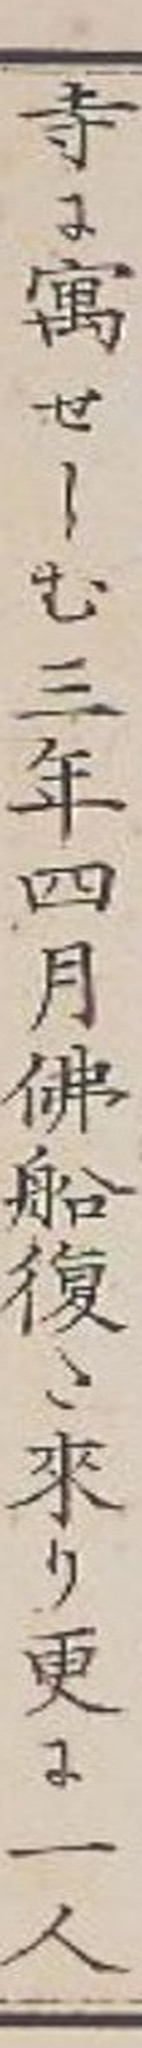寺に寓せしむ三年四月仏船復た来り更に一人
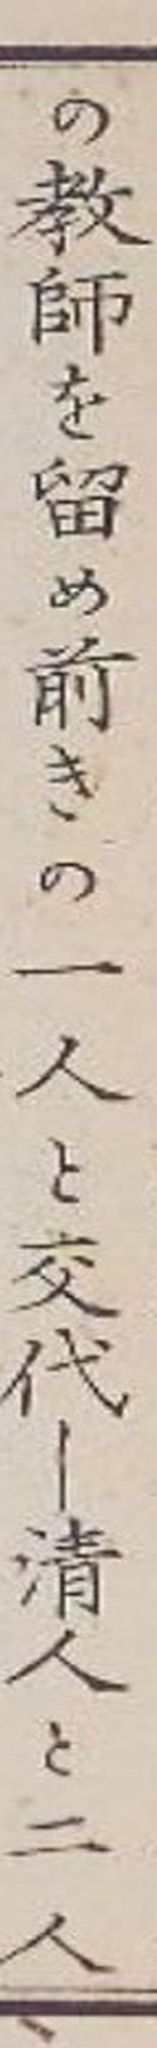の教師を留め前きの一人と交代し清人と二人
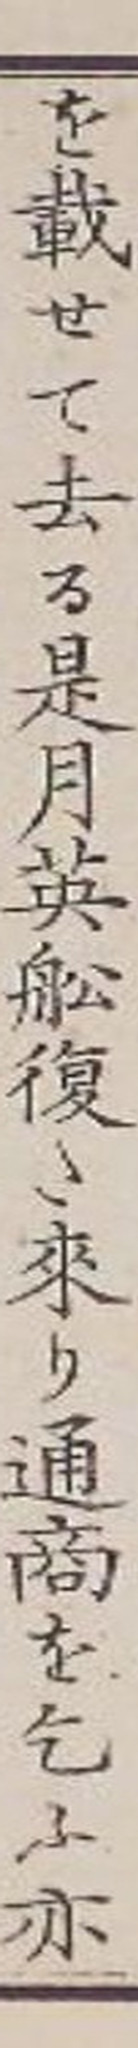を載せて去る是月英船復た来り通商を乞ふ亦
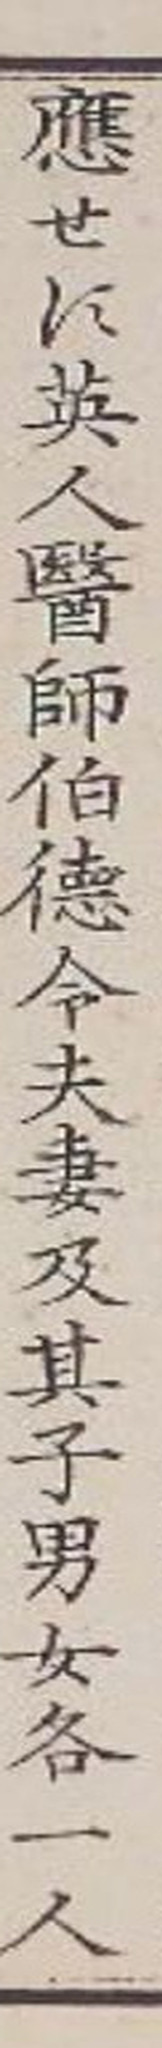応せす英人医師伯徳令夫妻及其子男女各一人
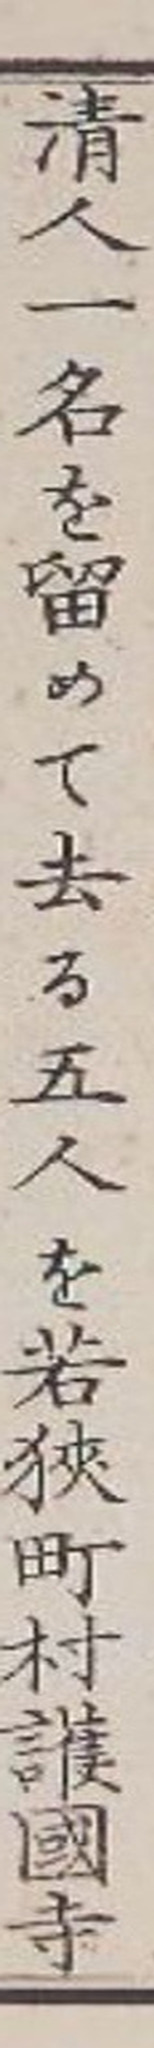清人一人を留めて去る五人を若狭町村護国寺
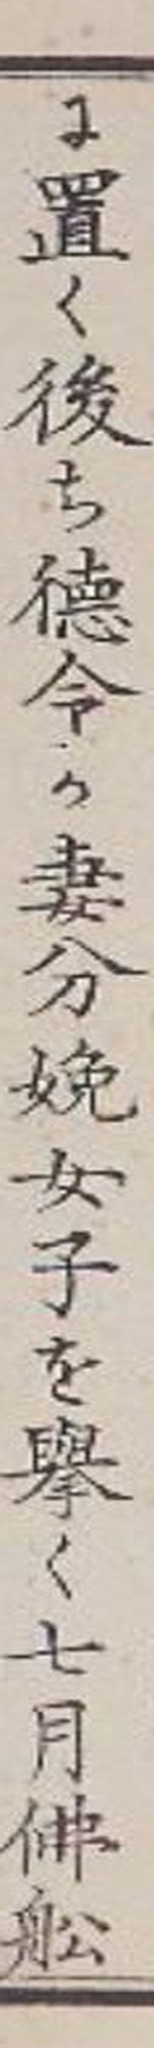に置く後ち徳令か妻分娩女子を挙く七月仏船
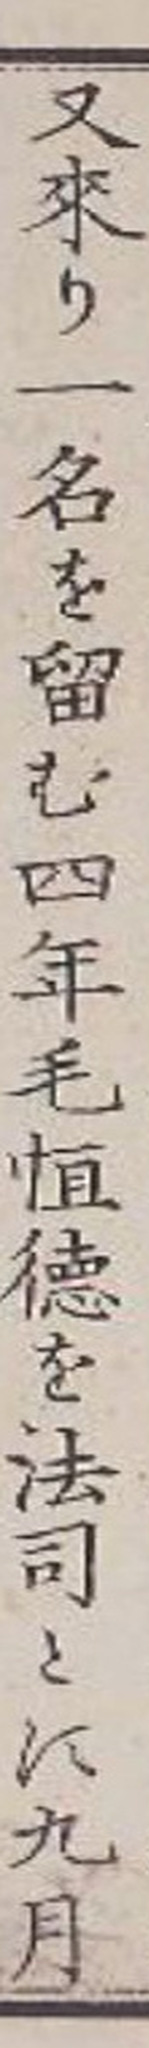又来り一名を留む四年毛恒徳を法司とす九月
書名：南島紀事 下
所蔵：University of the Ryukyus Library
